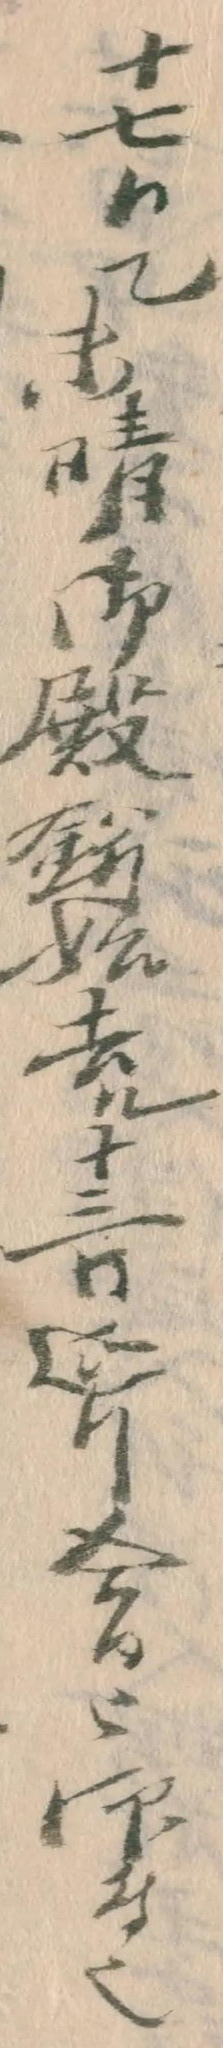十七日乙未晴御殿釿始去ル十三日延引今日被仰付也
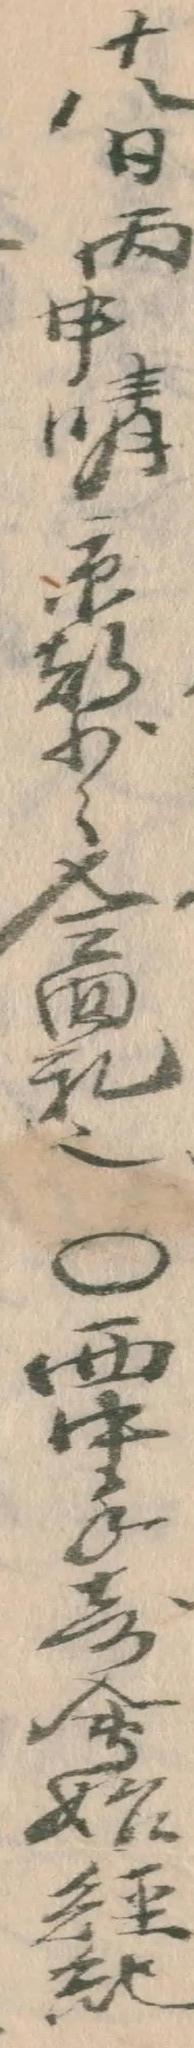十八日丙申晴京都少々令回礼也○西中手寄會始経紀
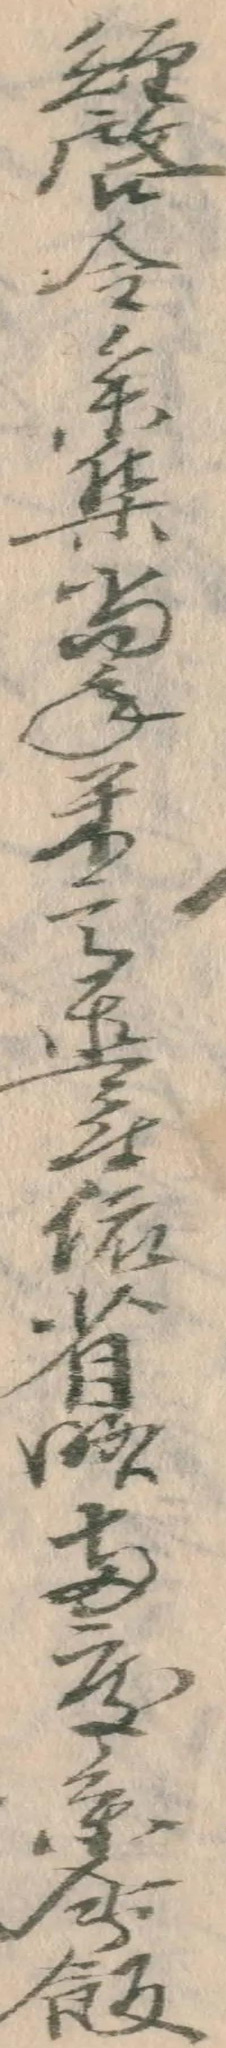経啓令参集當年米高直ニ付依省略両度参會飯
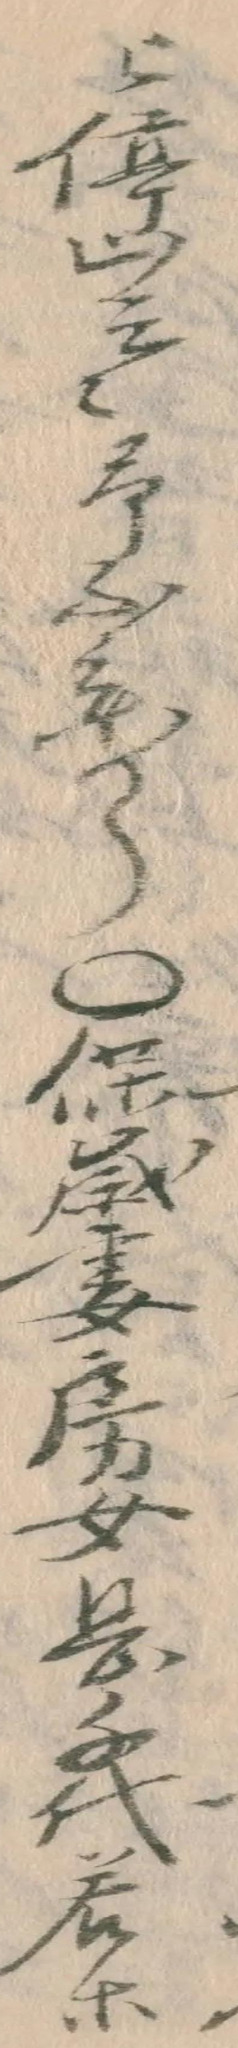被停止云々予不参了○保歳妻房女息千代君等
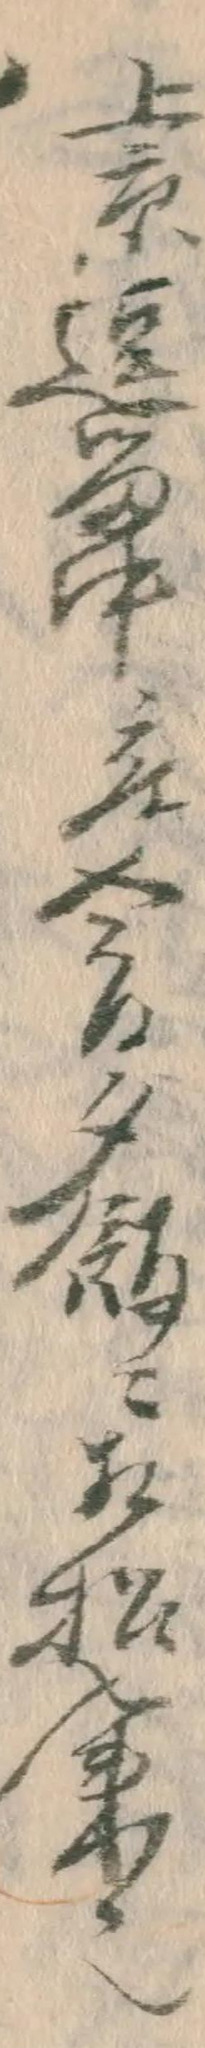上京逗留中ニ付今日夕飯ニ相招入来也
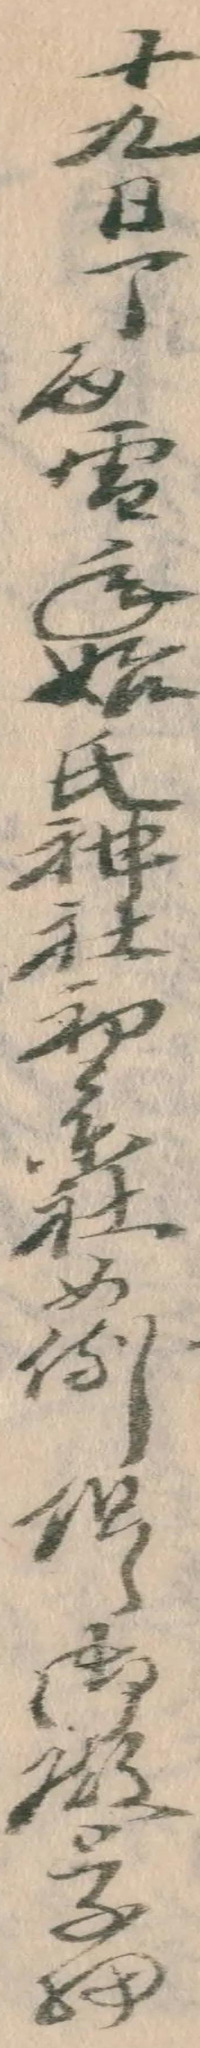十九日丁酉雪年始氏神社初参社如例但し御殿御子細
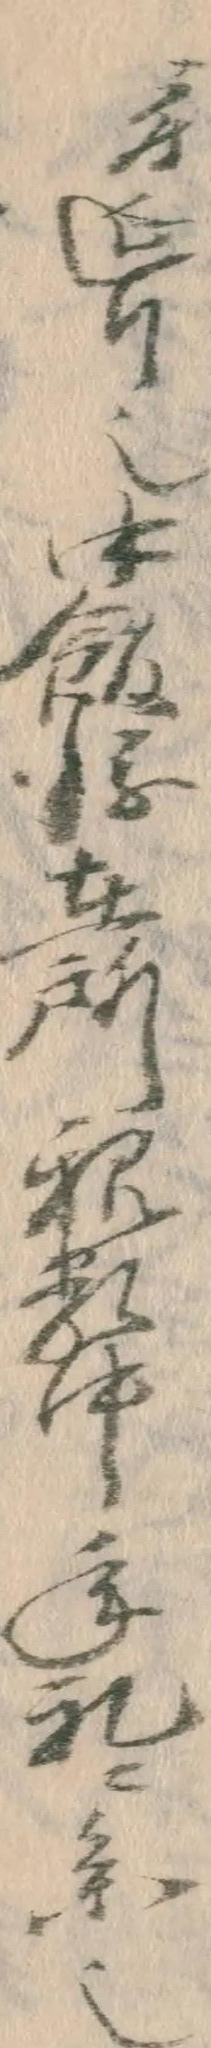ニ付延引也中飯後在所親類中年礼ニ参也
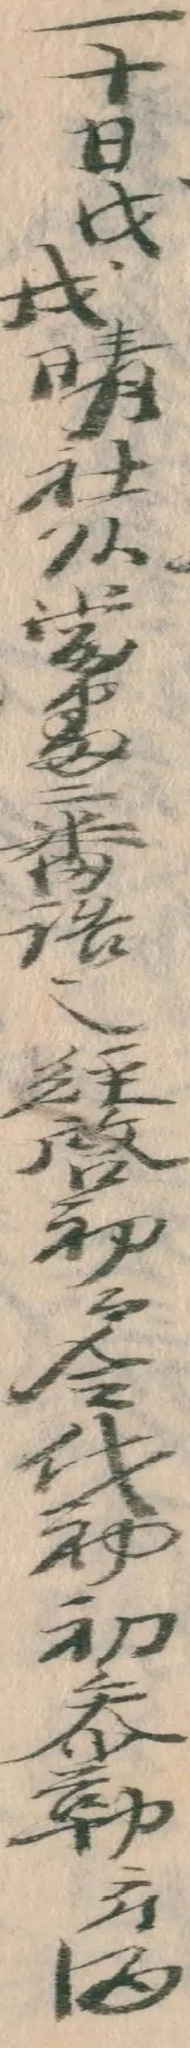二十日戊戌晴社頭當番二番詰也経啓初而令代勤初参勤ニ付酒
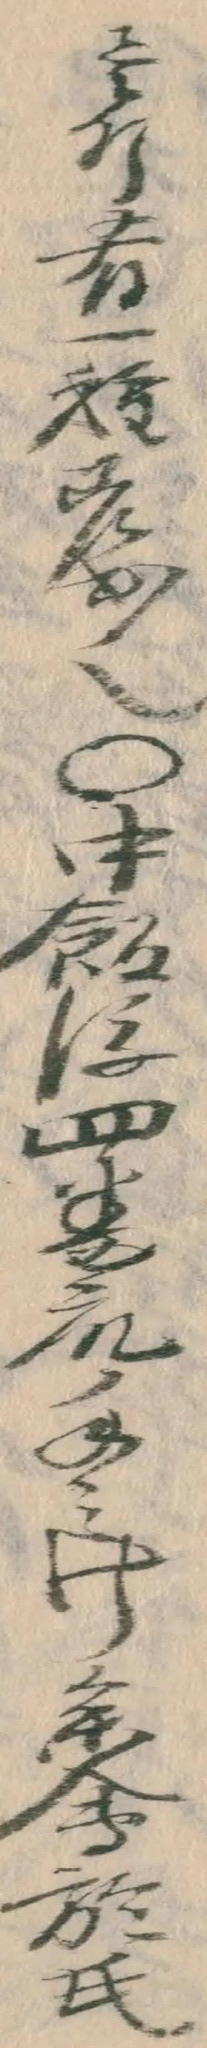壱升肴一種差出也○中飯後四番衆手之汁参會於氏
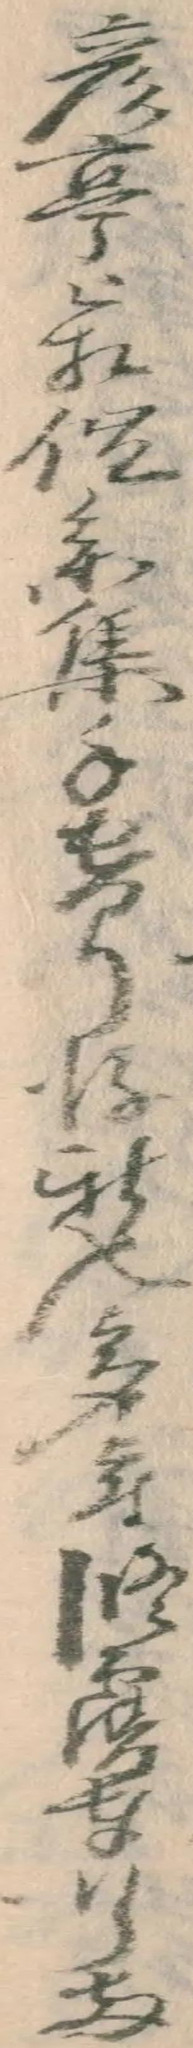彦亭被相催参集手替り後新入多ニ付修覆奉行両
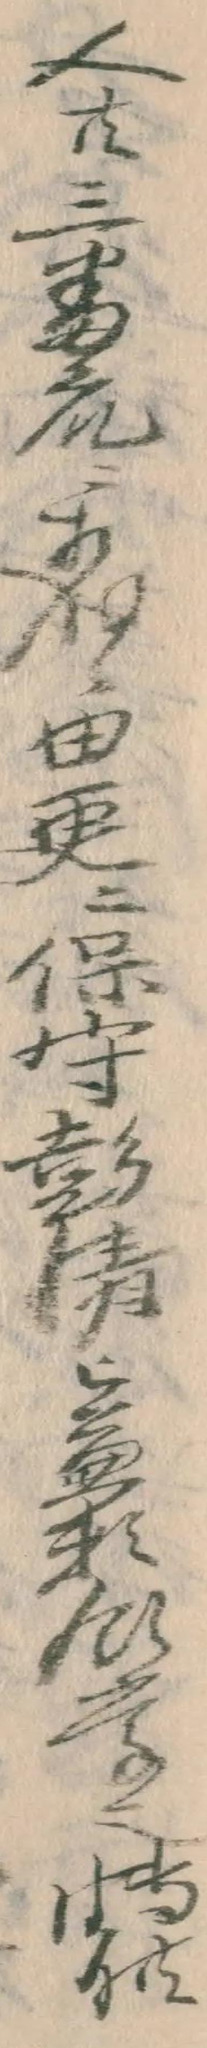人共三番衆ニ相成候由更ニ保守彭清被兼頼領掌也轉供
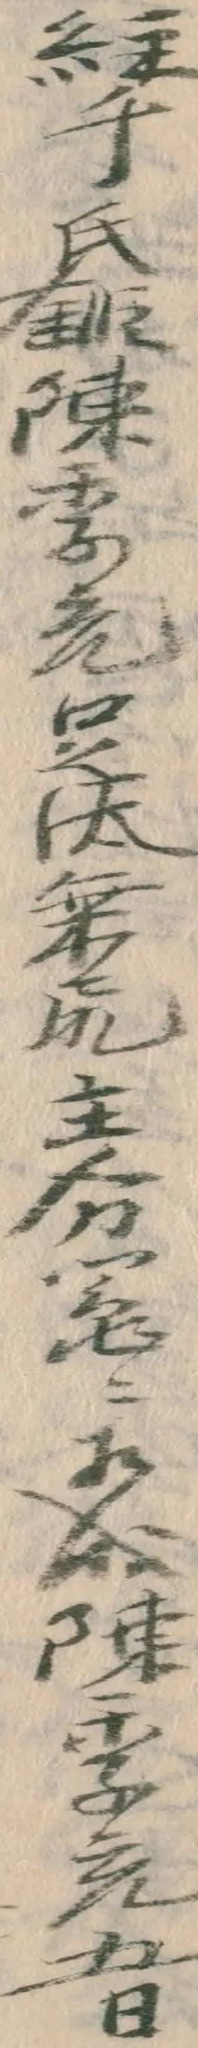経千氏鍛陳季充足汰乗尻主分鬮ニ相成陳季充五日
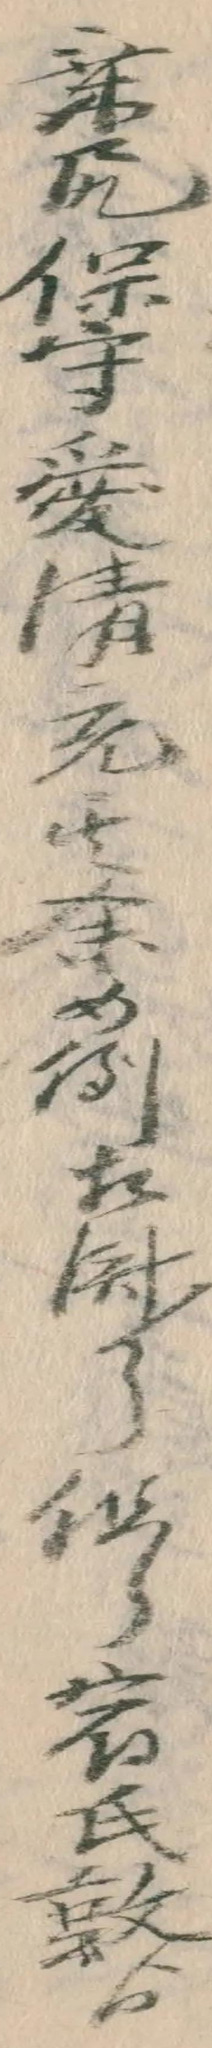乗尻保守愛清充其余如例相済了但し宿氏敦ゟ
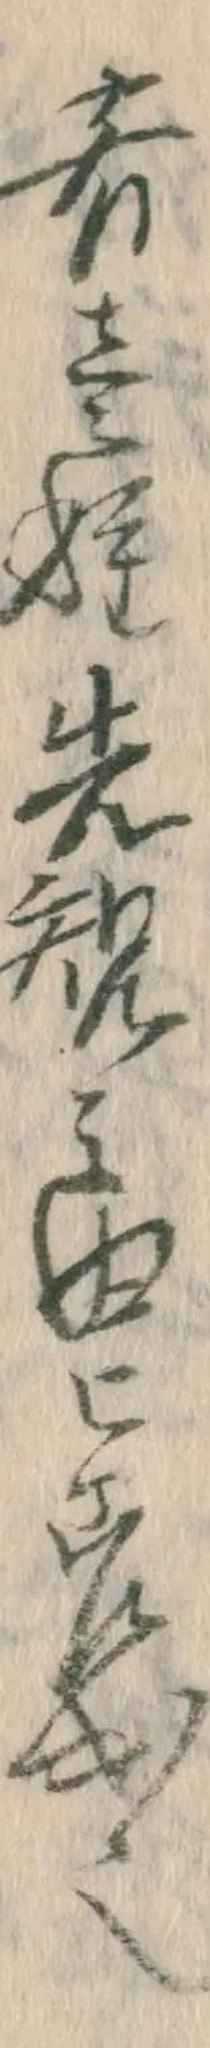肴壱種先規之由被差出也
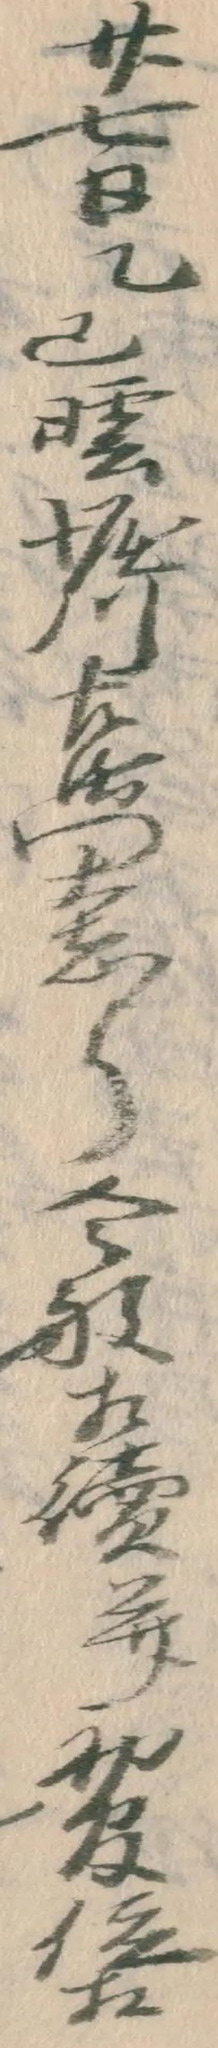廿七日乙巳曇堀川左衛門大志より今般相續幷初官位相
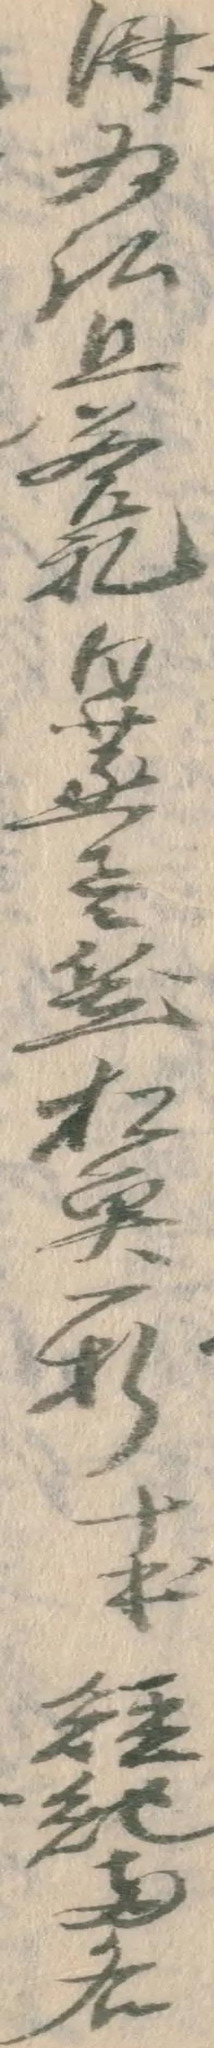済為仏且答礼白蒸壱器松魚一折十本経紀両名
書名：賀茂社記録. 第67冊
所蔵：国立国会図書館 National Diet Library, JAPAN
